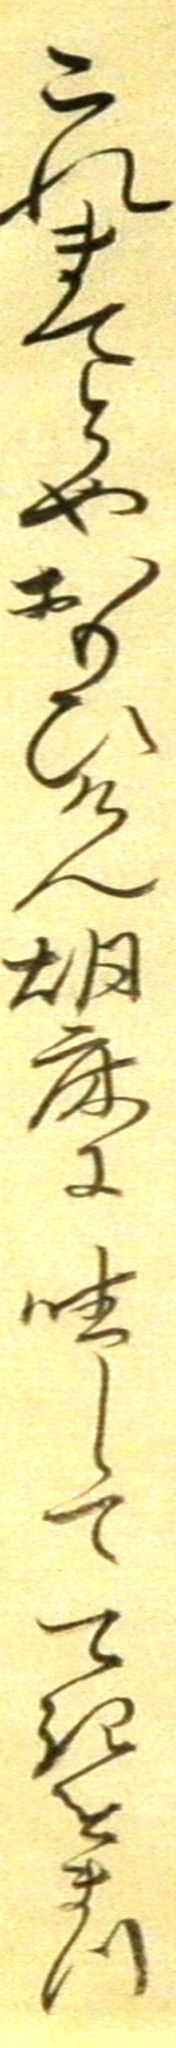これまてとやおもひけん胡床に坐しててきをまつ
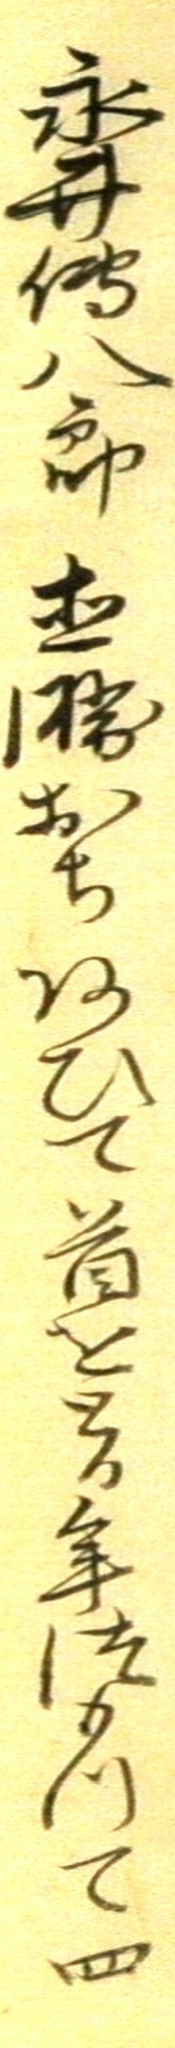永井伝八郎直勝おちあひて首をとる年つもつて四

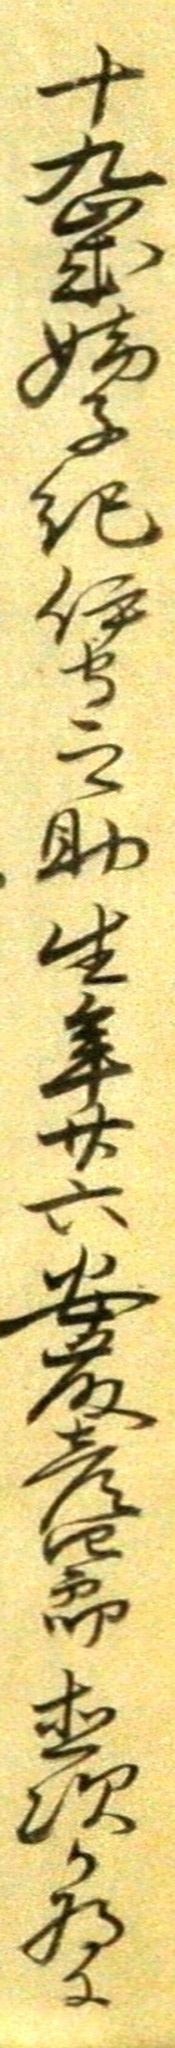十九歳嫡子紀伊守之助生年廿六安藤彦四郎直次か為に
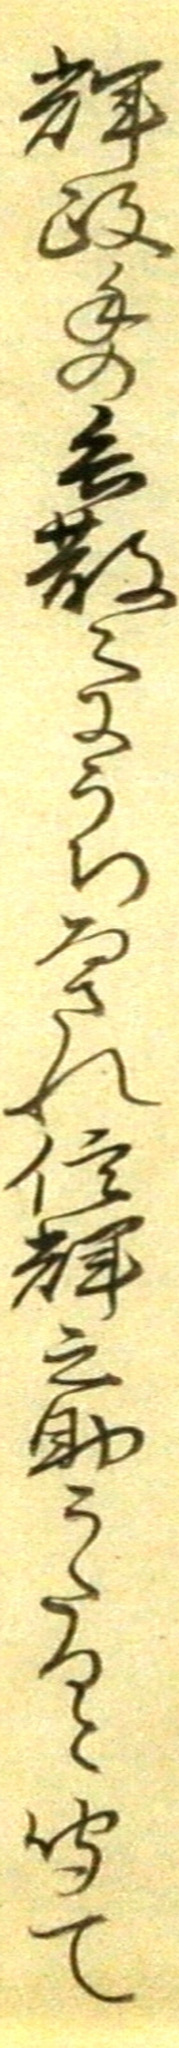輝政手の兵散々にうちうちなされ信輝之助うたると聞て
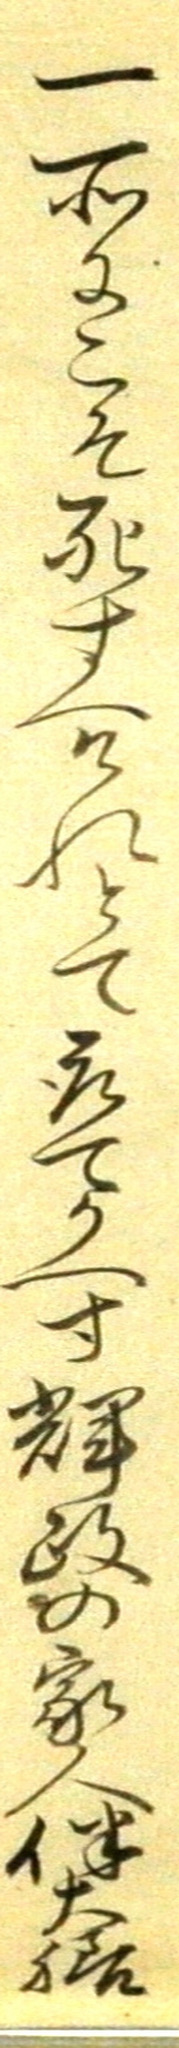一所にこそ死すへけれとて取てかへす輝政の家人伴大膳
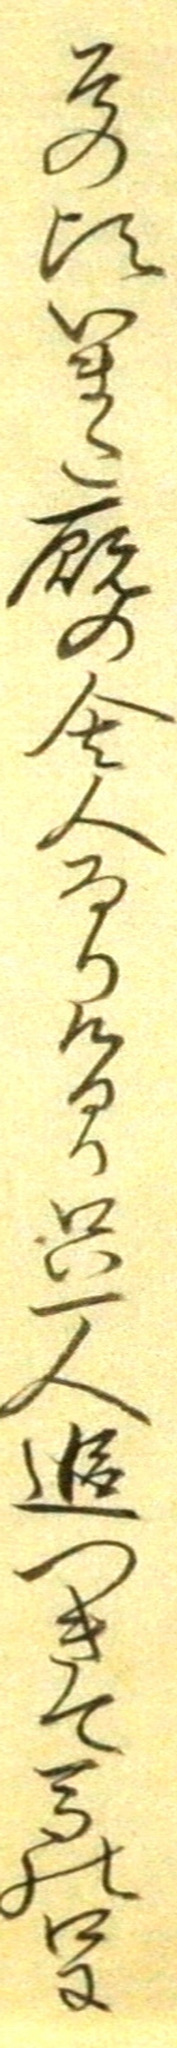その頃いまた廏の舎人なりけるか只一人追つきて馬の口に
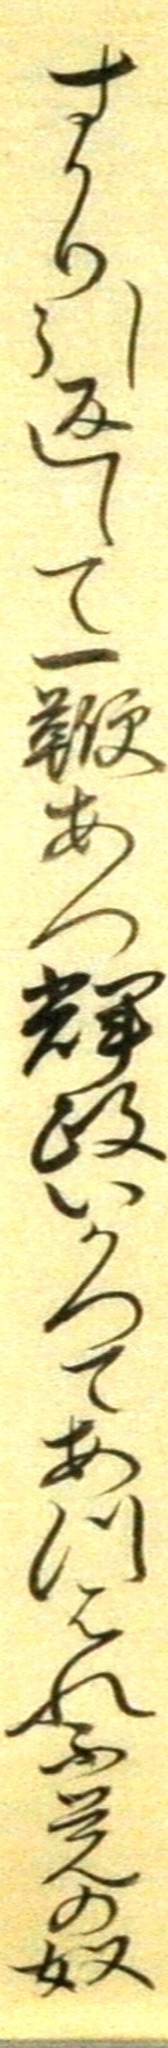すかり引返して一鞭あつ輝政いかつてあつはれ不覚の奴
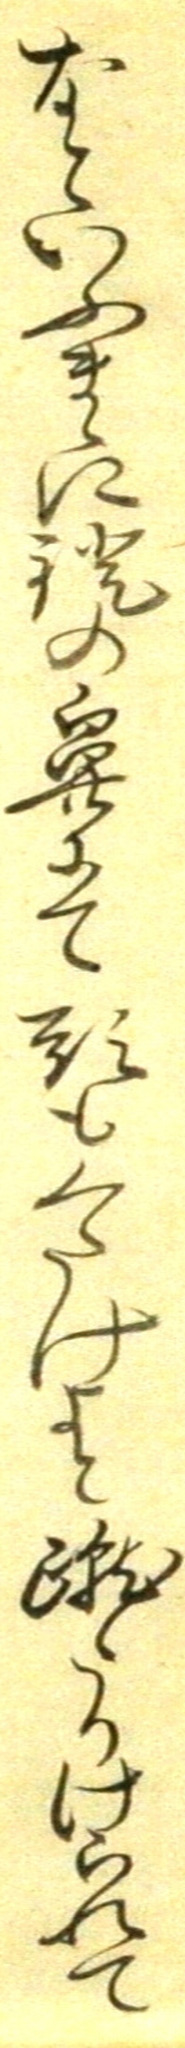なといふまゝに鐙の鼻にて頭もくたけよと蹴りたりけられて
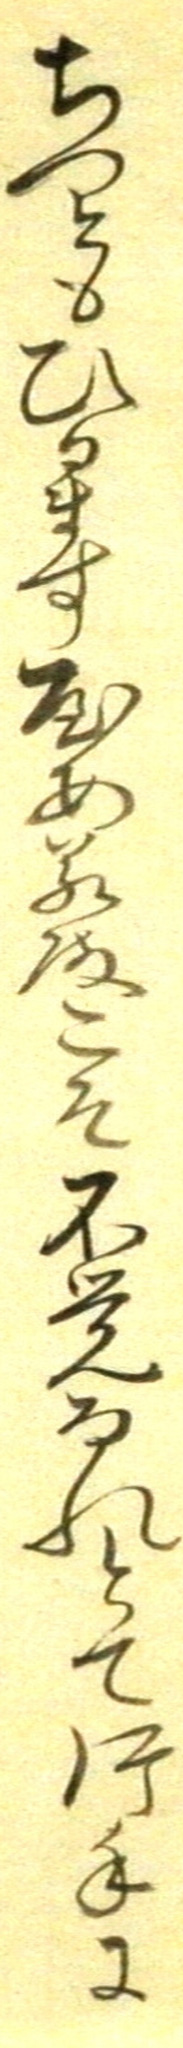ちつともひるますやあ若殿こそ不覚ななれとて片手に
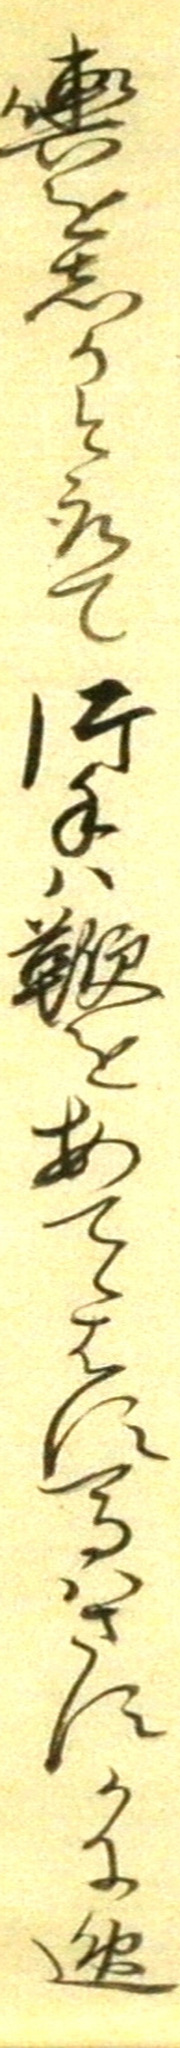轡をしかと取て片手は鞭をあてゝはす馬はさすかに逸
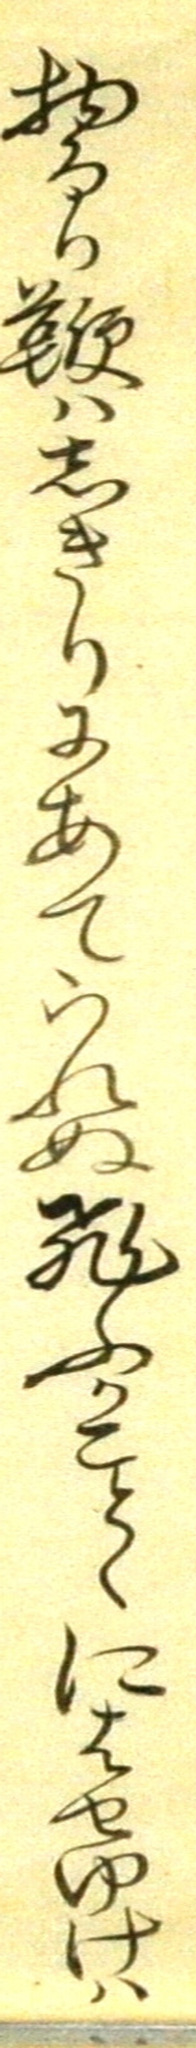物なり鞭はしきりにあてられぬ飛ふかことくにはせゆけは
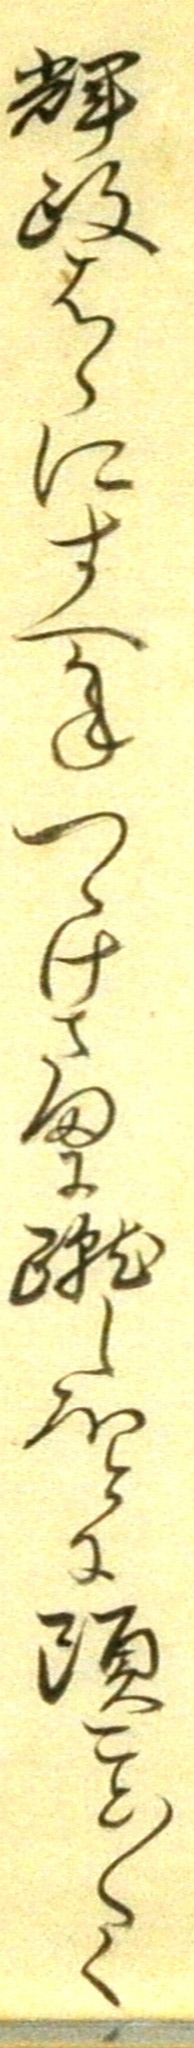輝政はらにすへかねつゝけさまに蹴しほとに頭こと〳〵く
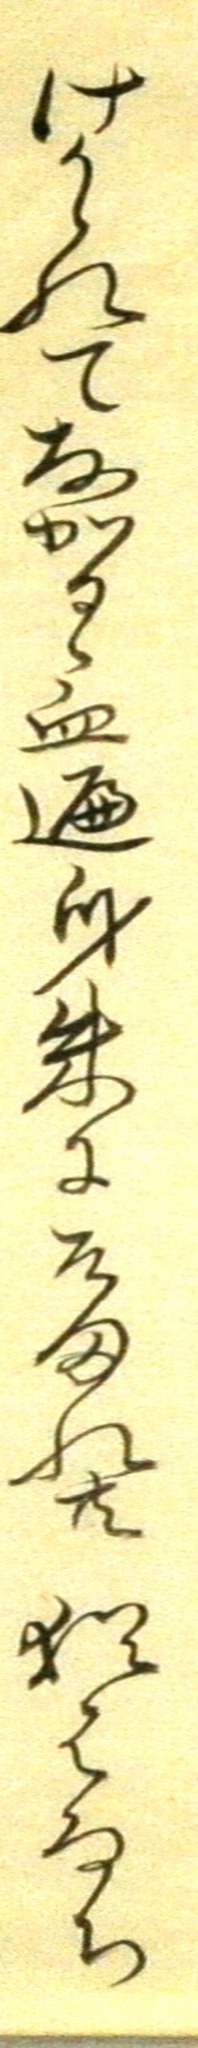けかれてなかるゝ血遍身朱にそまれ共猶はなち
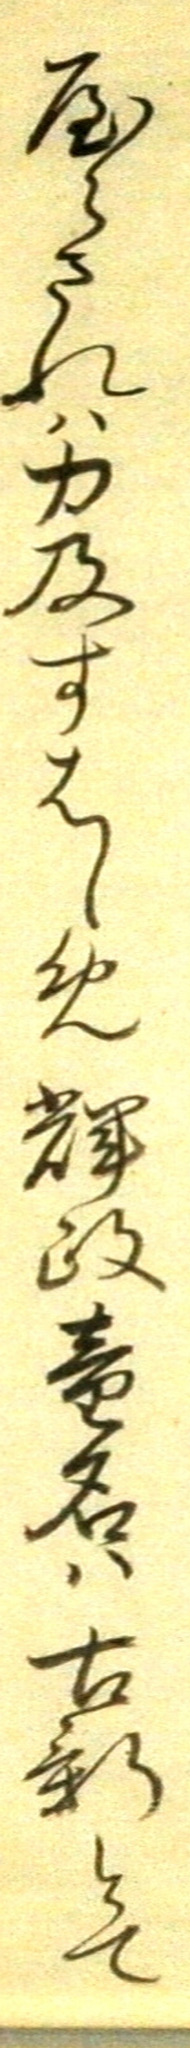やらされは力及すはしめ輝政童名は古新とて
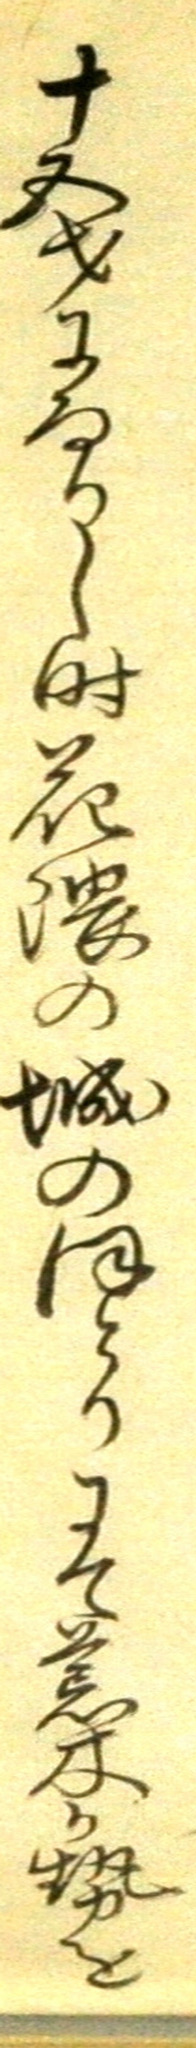十五才になりし時花隈の城のほとりにて荒木か勢を
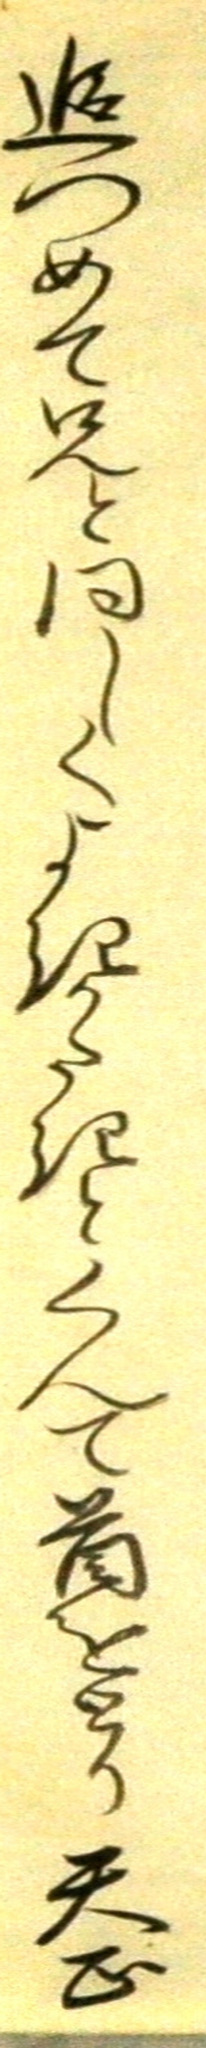追つめて兄と同しくよきかたきとくんて首をとり天正
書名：藩翰譜（七・上）
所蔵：伊那市立高遠町図書館・合同会社AMANE
